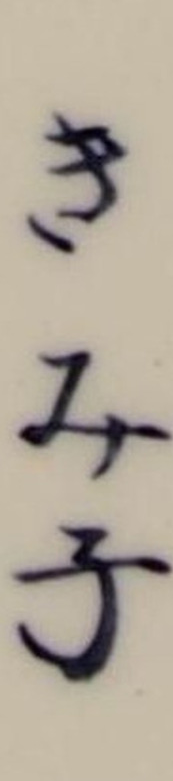きみ子
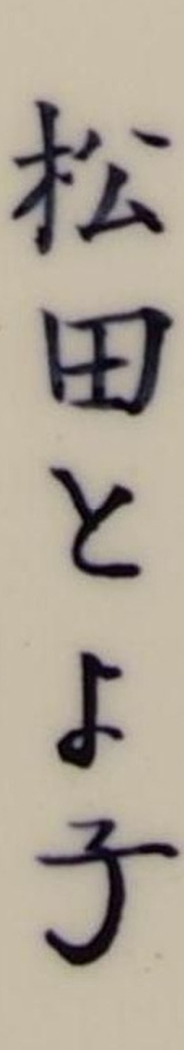松田とよ子
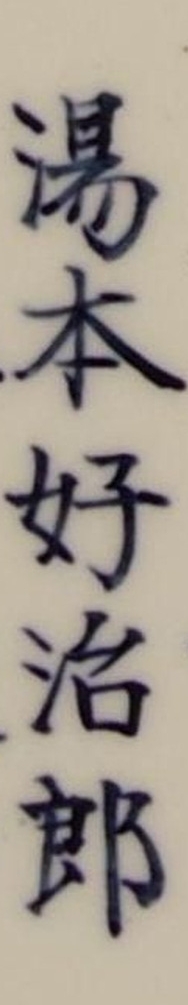湯本好治郎
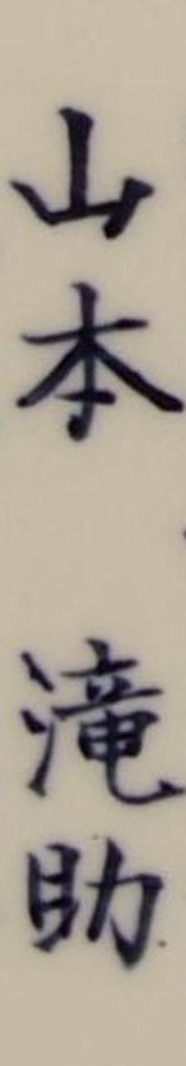山本滝助
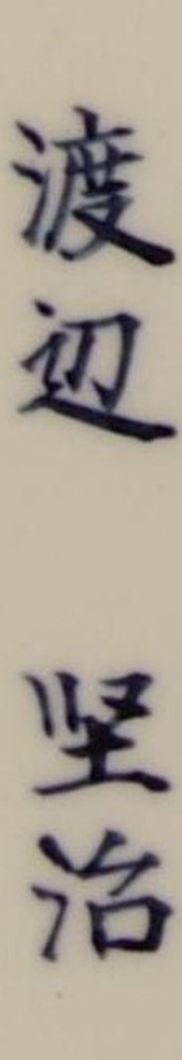渡辺堅治
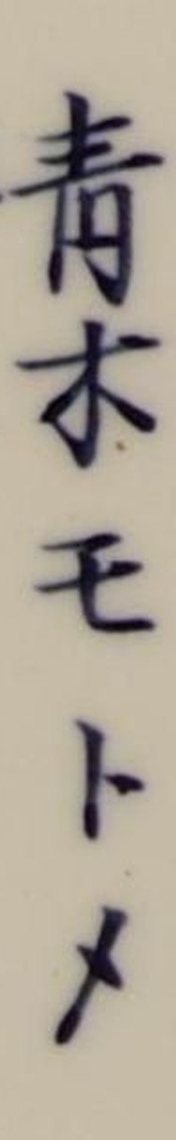青木モトメ
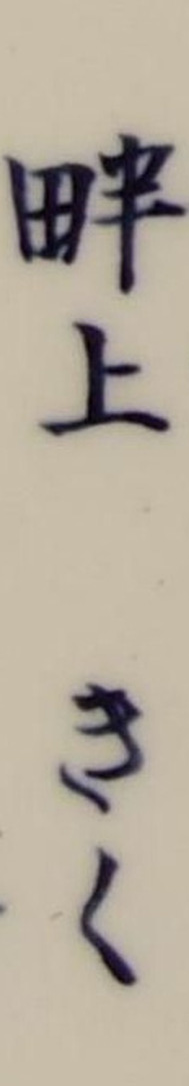畔上きく
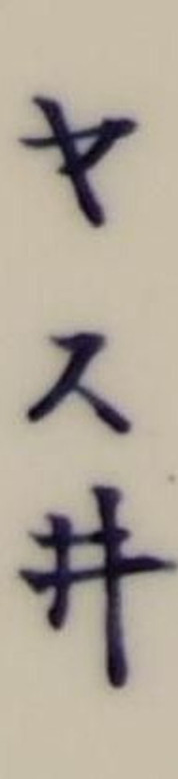ヤスイ
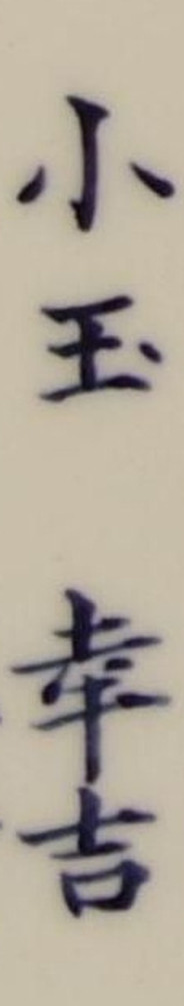小玉幸吉
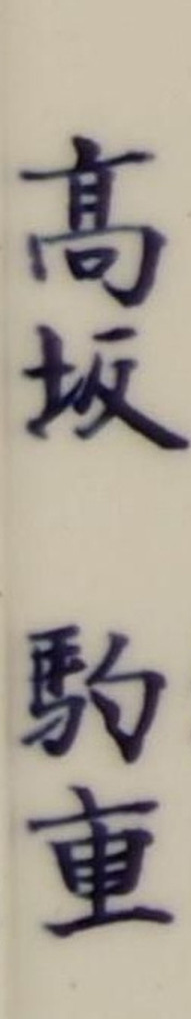高坂駒重

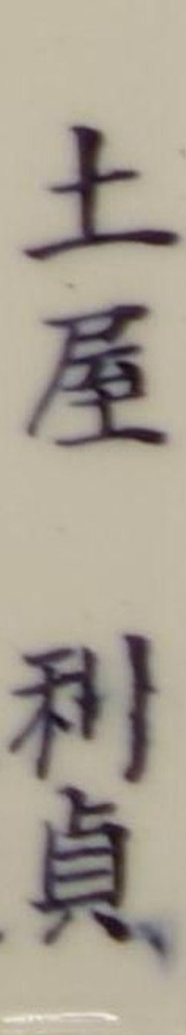土屋利貞
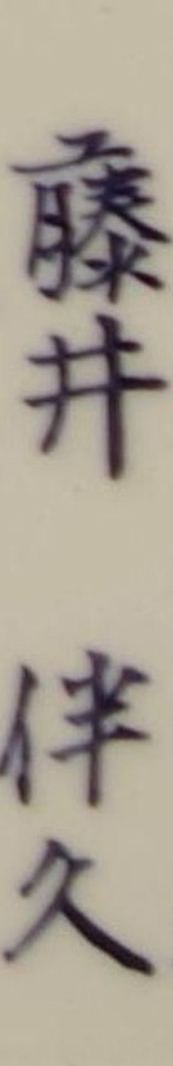藤井伴久
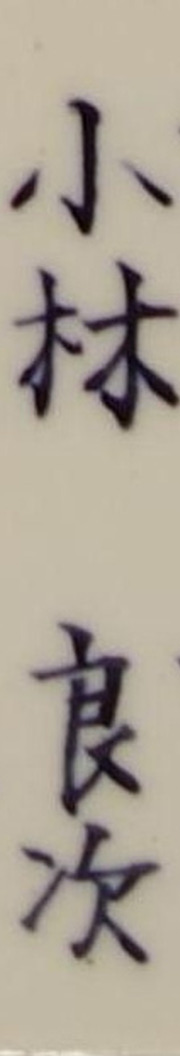小林良次
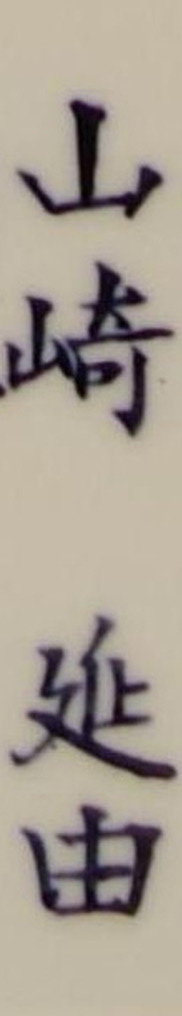山崎延由
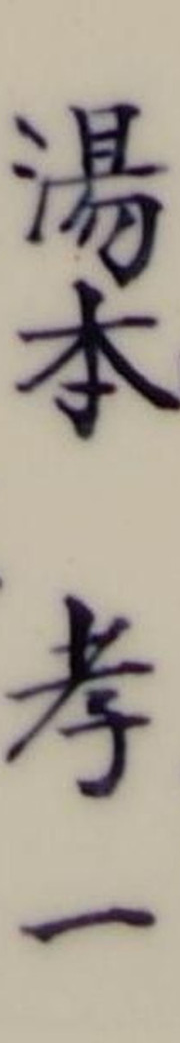湯本孝一
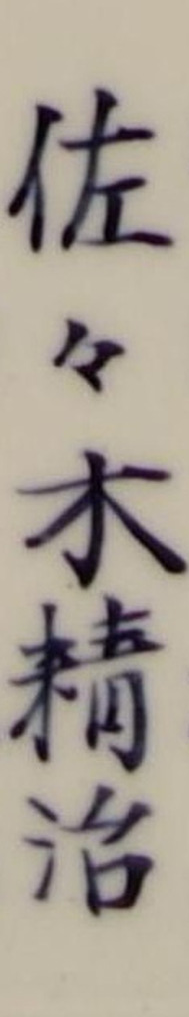佐々木精治
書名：E~L
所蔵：高野山金剛峯寺
